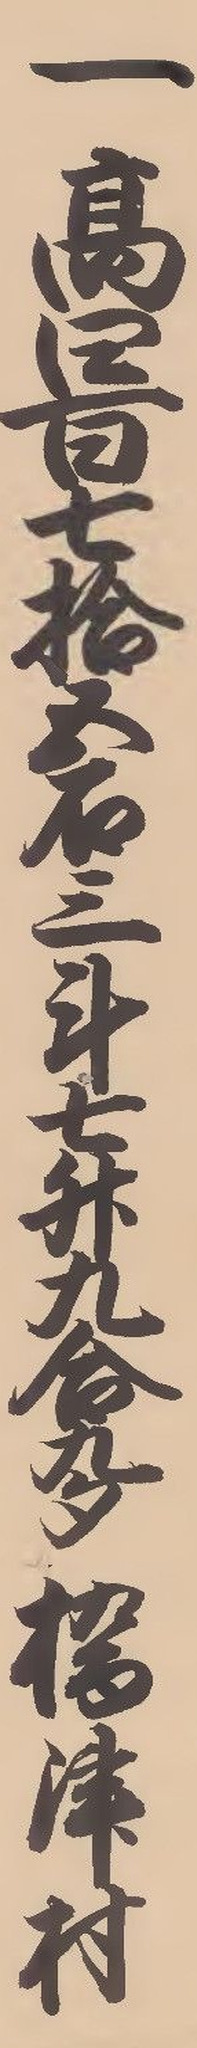一髙四百七拾五石三斗七升九合九夕橋津村
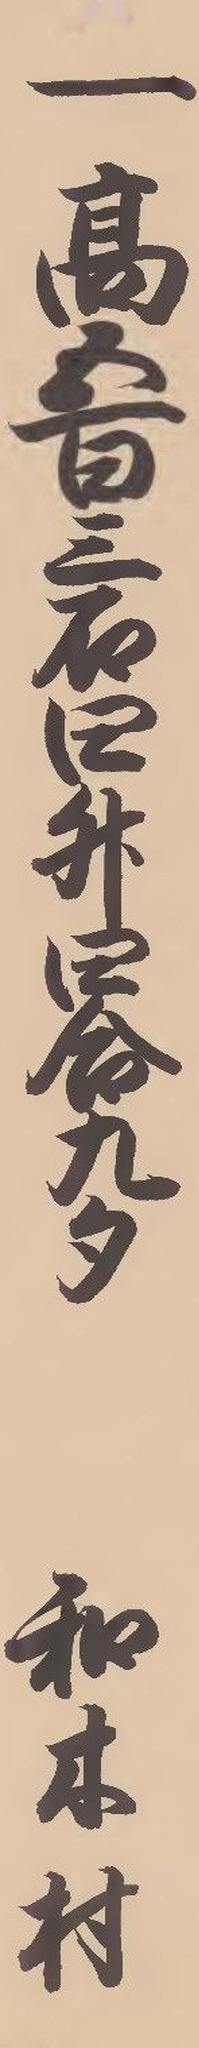一髙五百三石四升四合九夕和木村
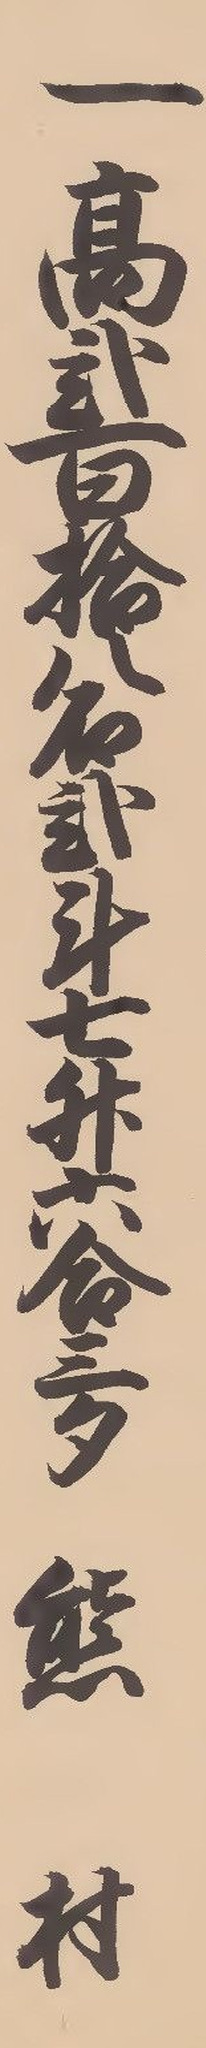一髙弐百拾八石弐斗七升六合三夕熊村
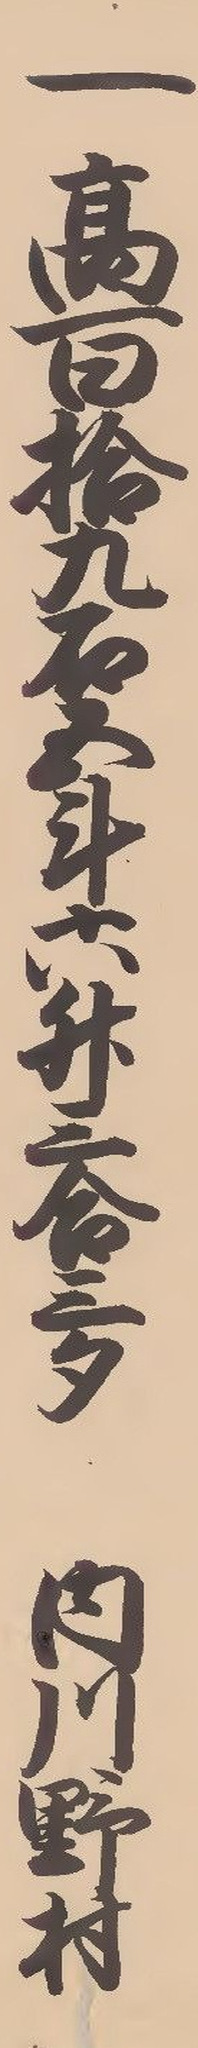一髙百拾九石五斗六升三合三夕内川野村
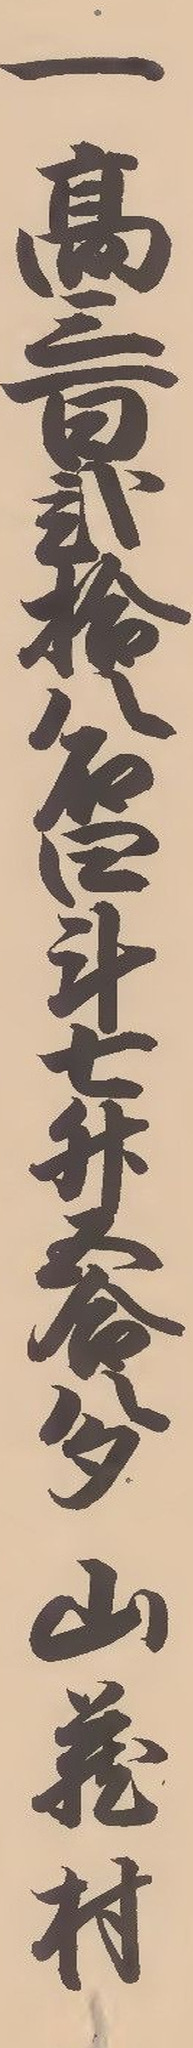一髙三百弐拾八石四斗七升五合八夕山藏村
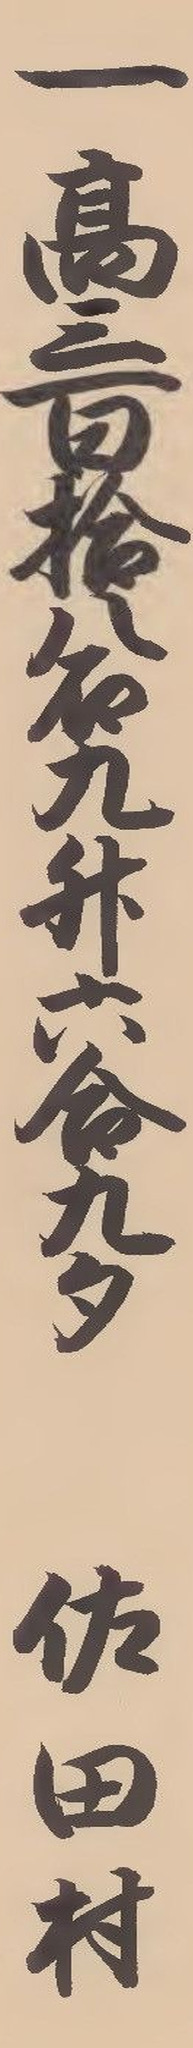一髙三百拾八石九升六合九夕佐田村
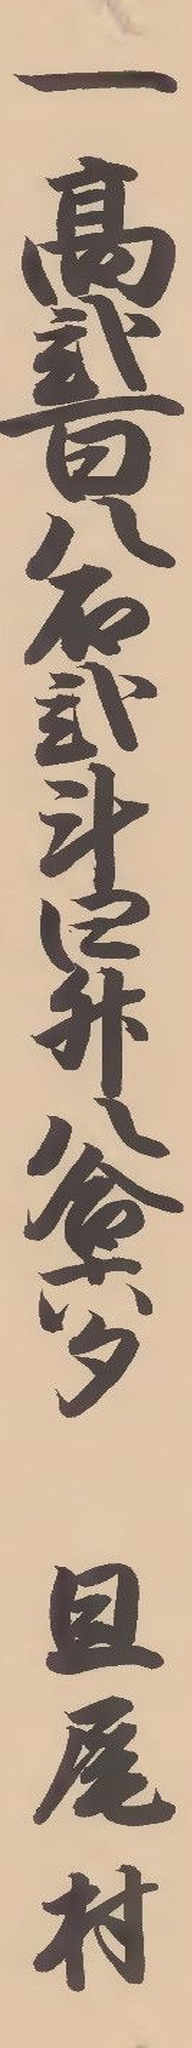一髙弐百八石弐斗四升八合六夕且尾村
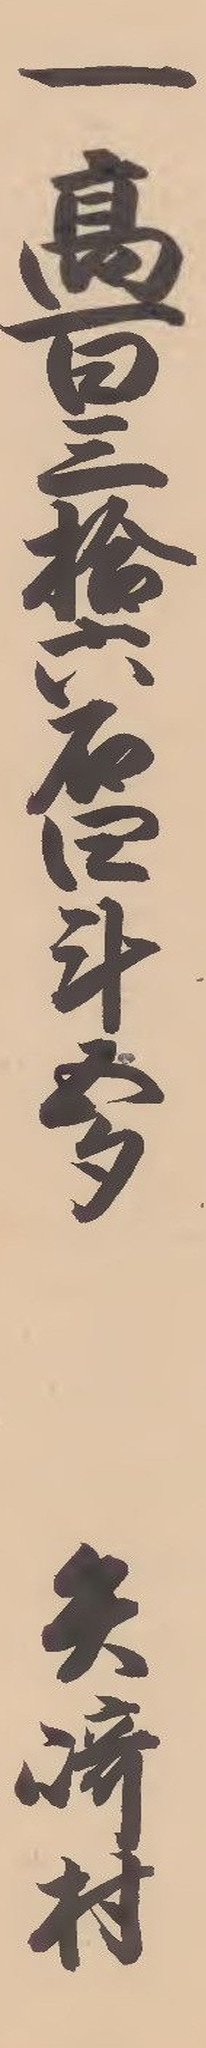一髙百三拾六石四斗五夕矢崎村

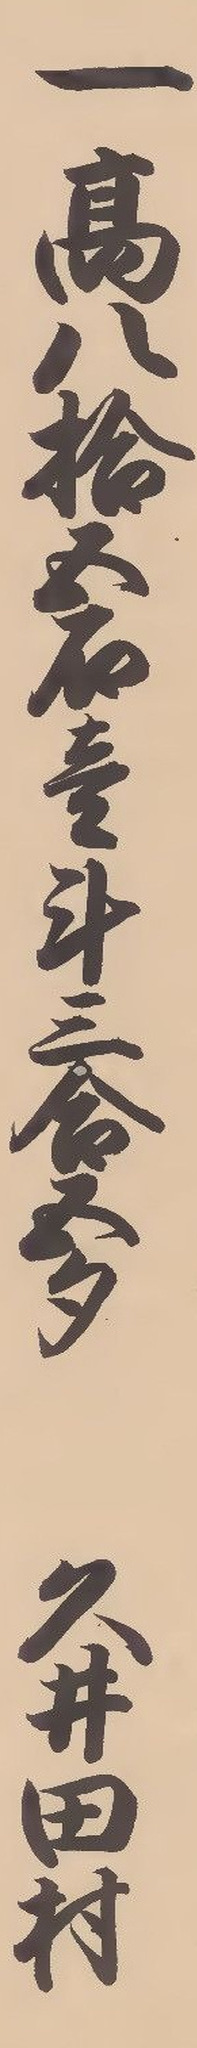一髙八拾五石壱斗三合五夕久井田村
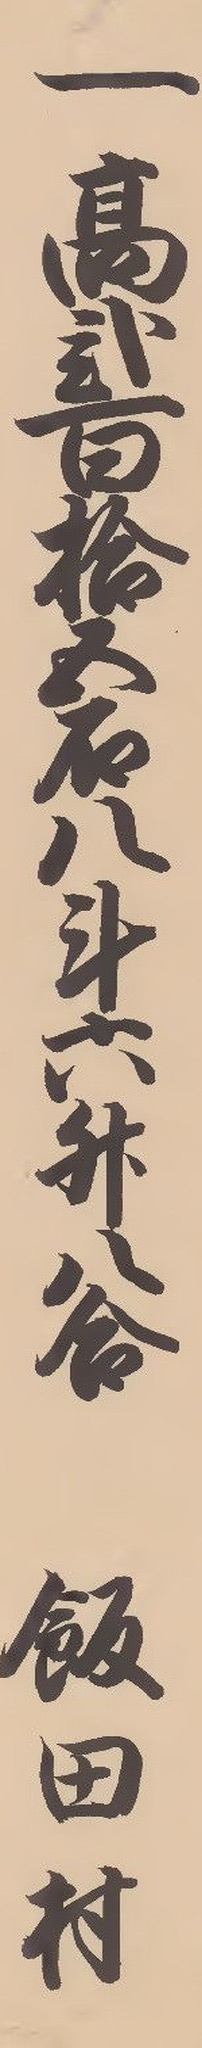一髙弐百拾五石八斗六升八合飯田村
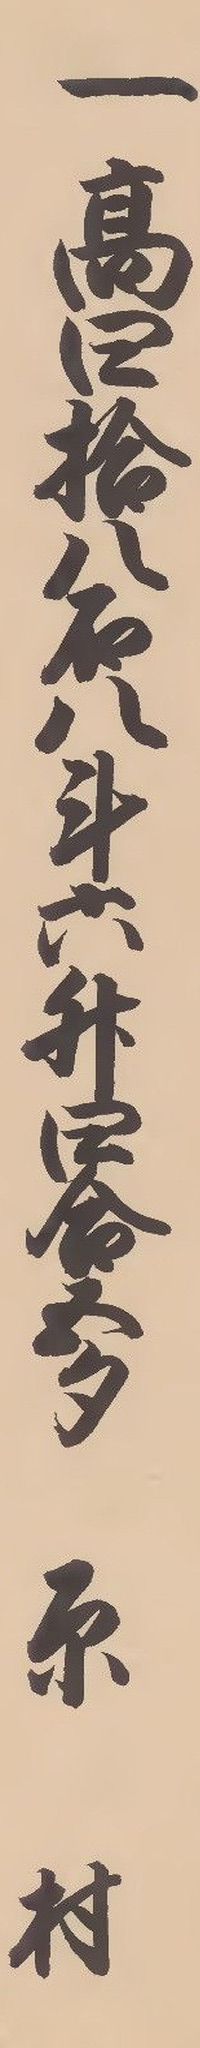一髙四拾八石八斗六升四合五夕原村
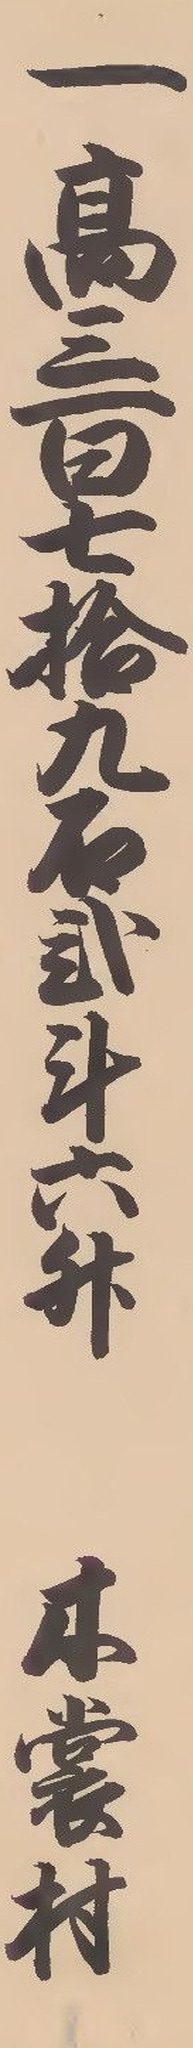一髙三百七拾九石弐斗六升木裳村
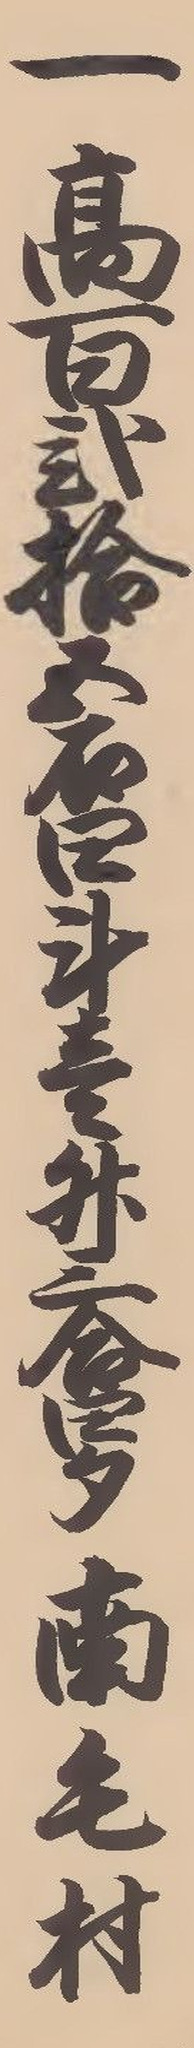一髙百弐拾五石四斗壱升三合四夕南毛村
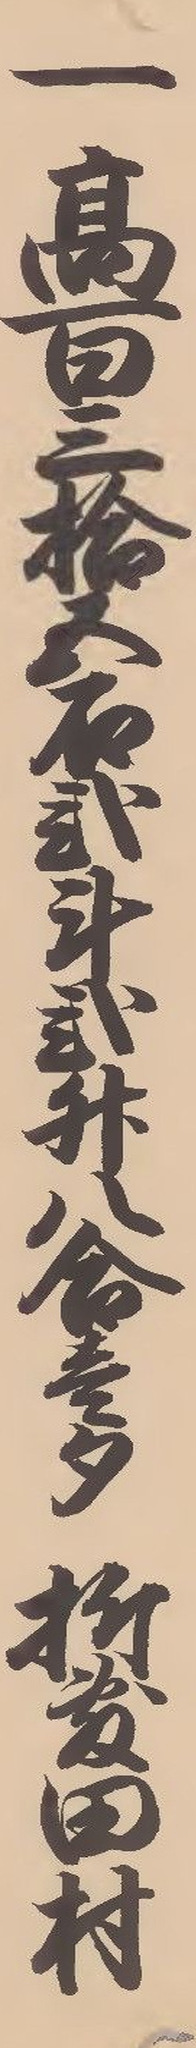一髙百三拾五石弐斗弐升八合壱夕折敷田村
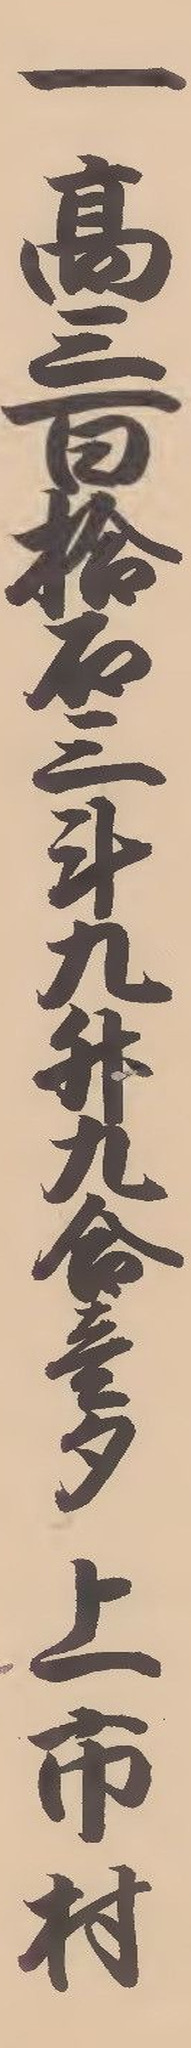一髙三百拾石三斗九升九合壱夕上市村

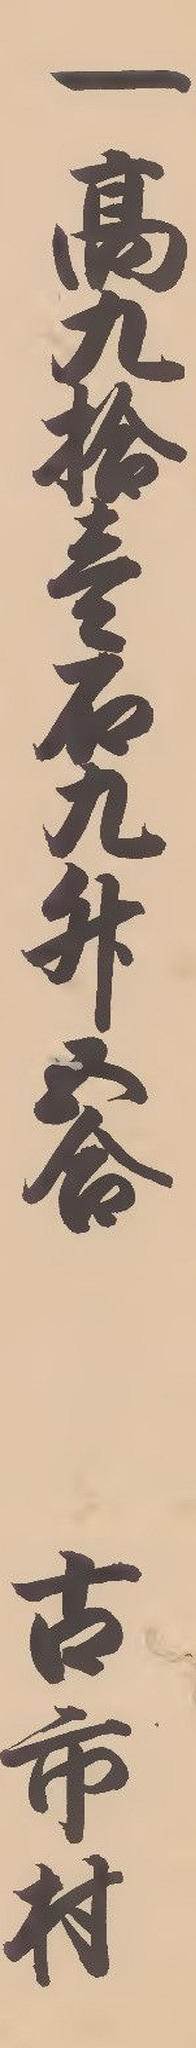一髙九拾壱石九升五合古市村
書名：豊前国郷帳
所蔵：国立公文書館 National Archives of Japan
